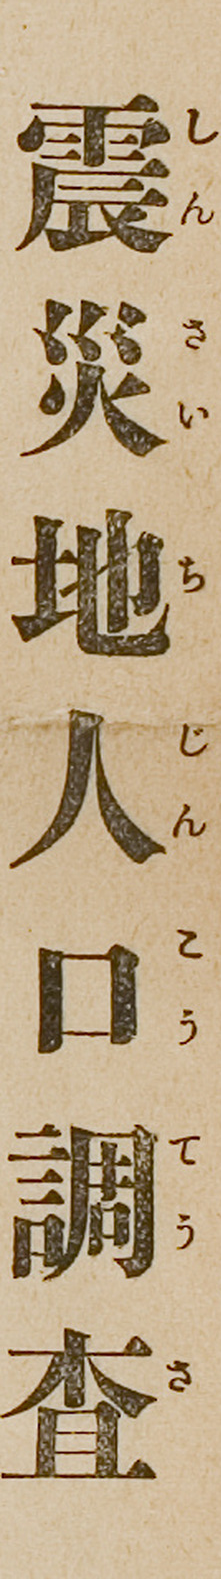震災地人口調査
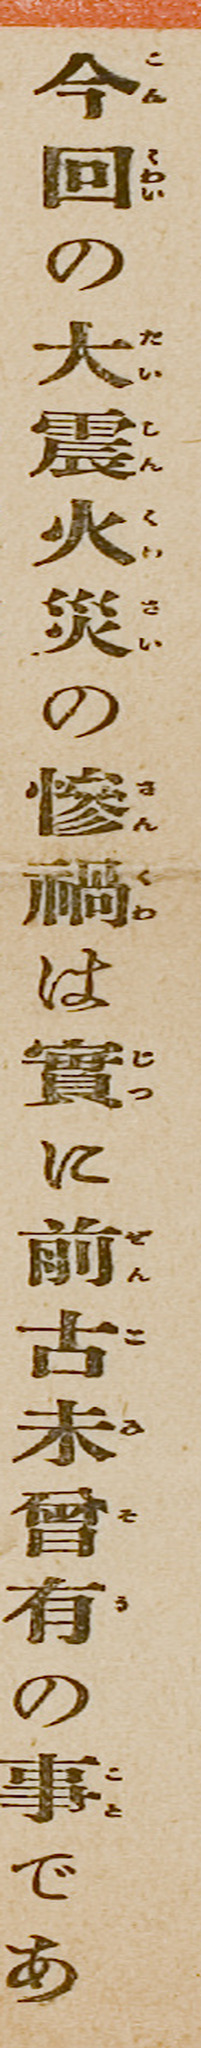今回の大震火災の惨禍は実に前古未曾有の事であ
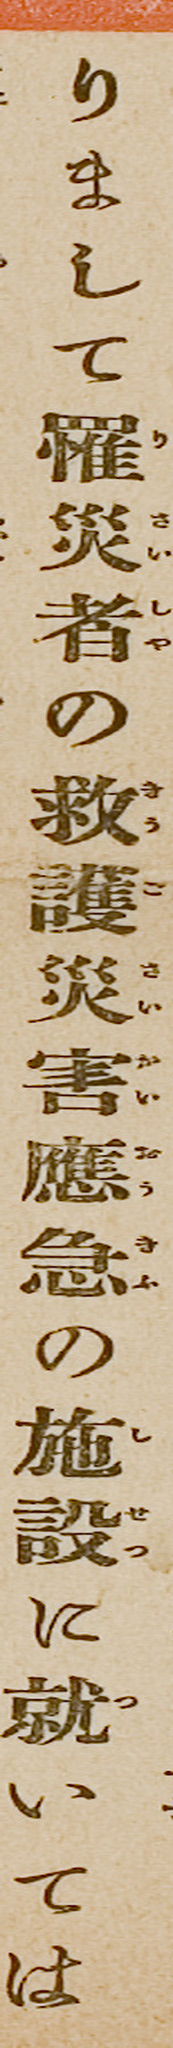りまして罹災者の救護災害応急の施設に就いては
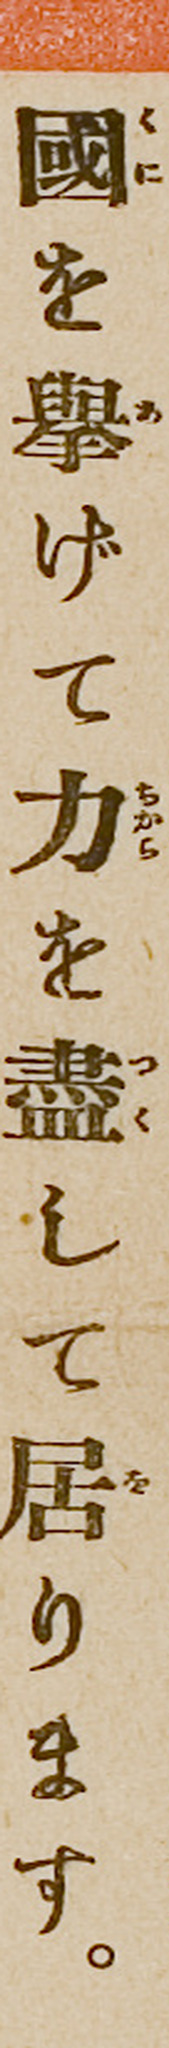国を挙げて力を尽して居ります。
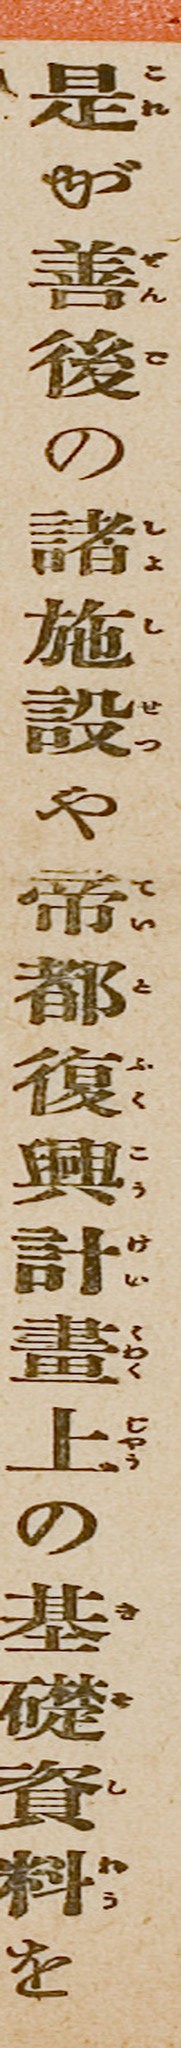是が善後の諸施設や帝都復興計画上の基礎資料を
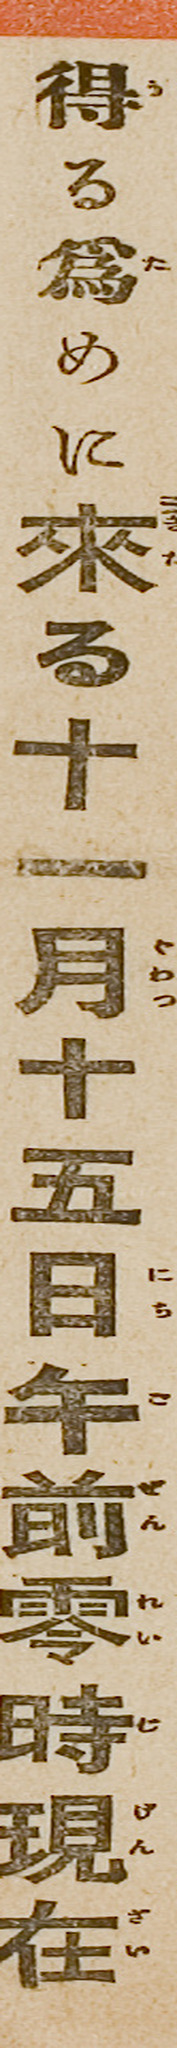得る為めに来る十一月十五日午前零時現在
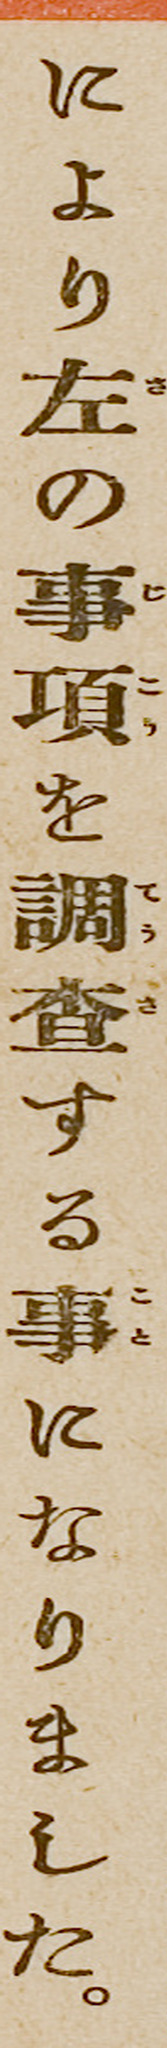により左の事項を調査する事になりました。
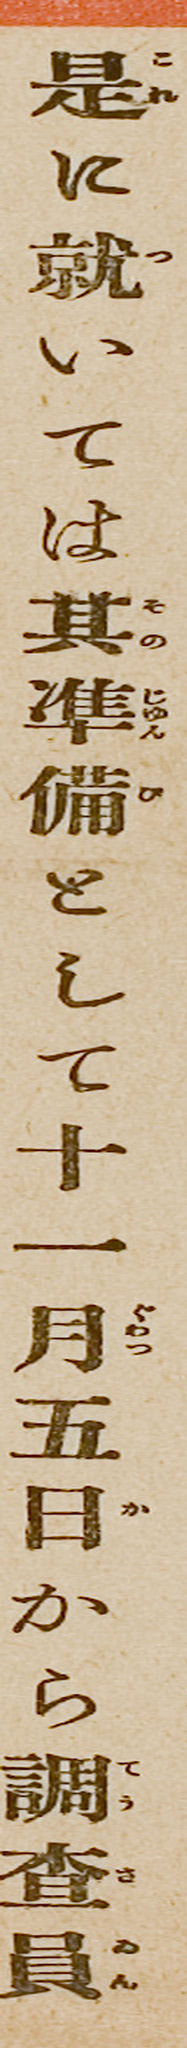是に就いては其準備として十一月五日から調査員
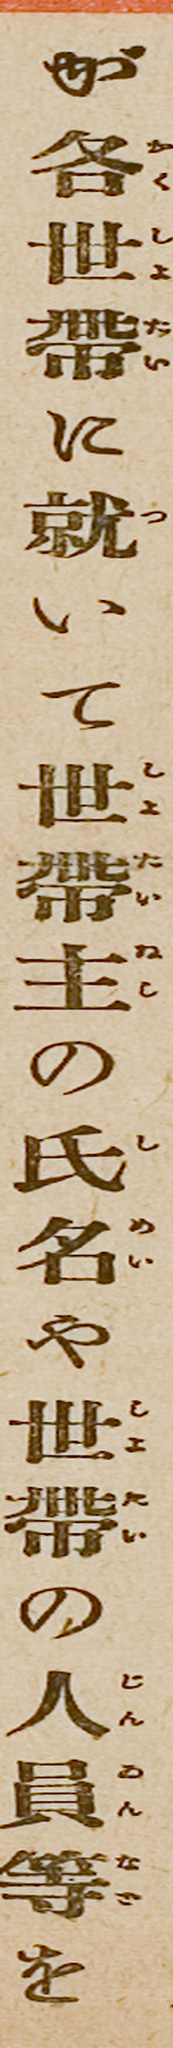が各世帯に就いて世帯主の氏名や世帯の人員等を
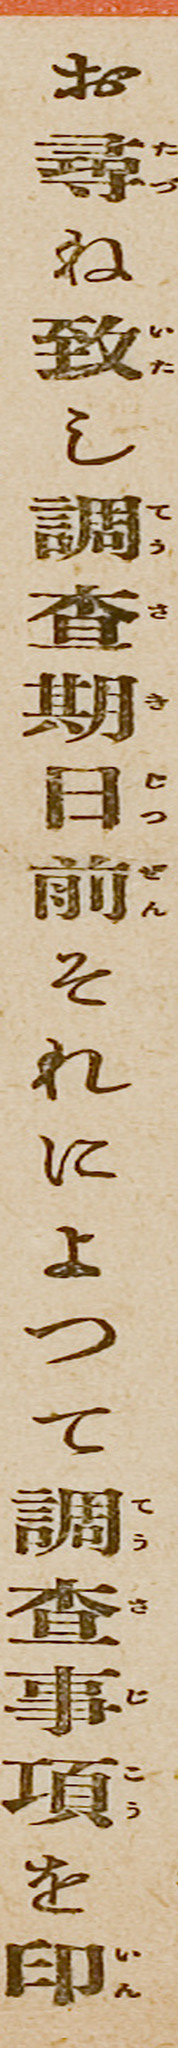お尋ね致し調査期日前それによつて調査事項を印
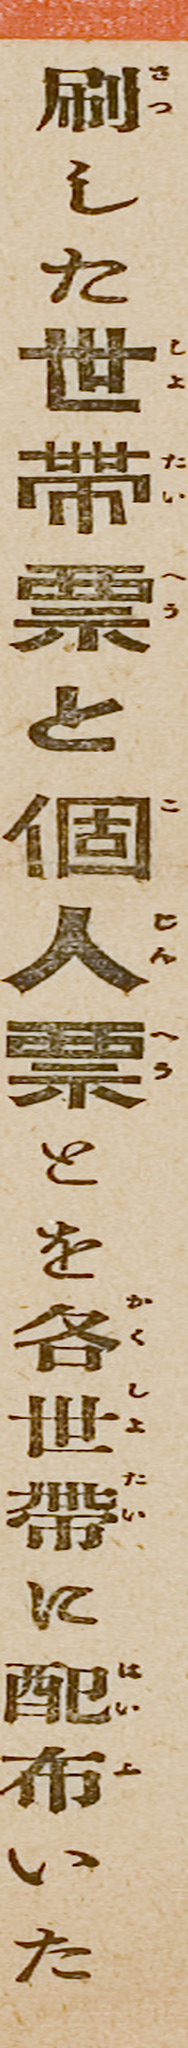刷した世帯票と個人票とを各世帯に配布いた
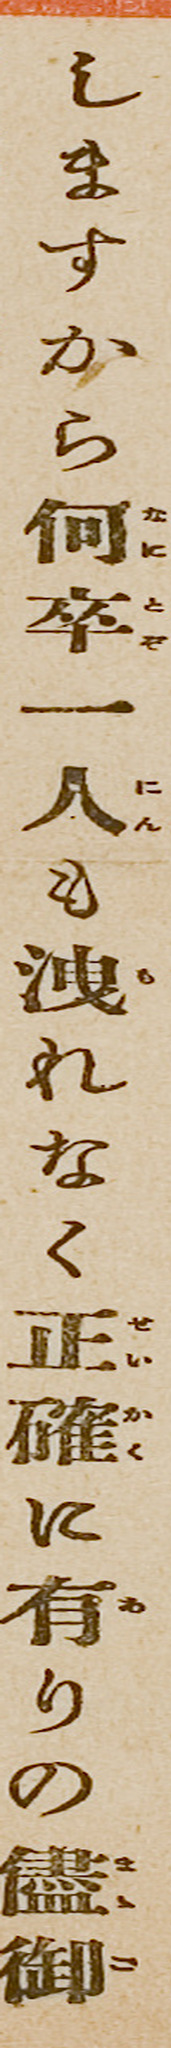しますから何卒一人も洩れなく正確に有りの儘御
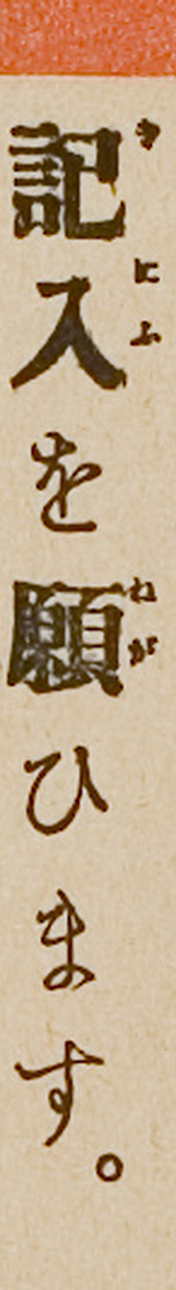記入を願ひます。
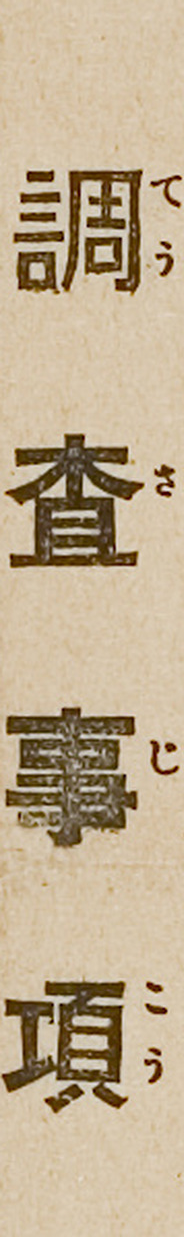調査事項
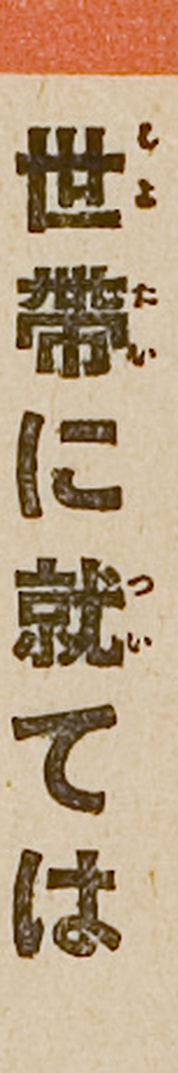世帯に就ては
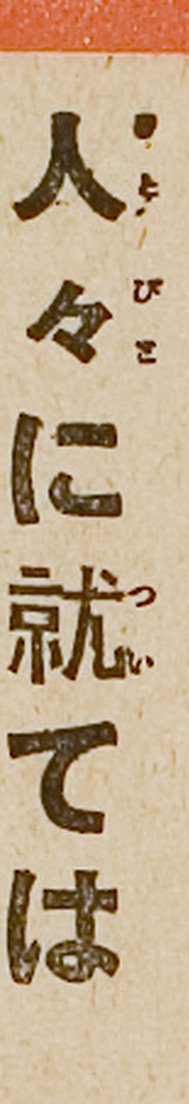人々に就ては
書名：震災地人口調査
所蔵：東京大学総合図書館 General Library in the University of Tokyo, JAPAN
